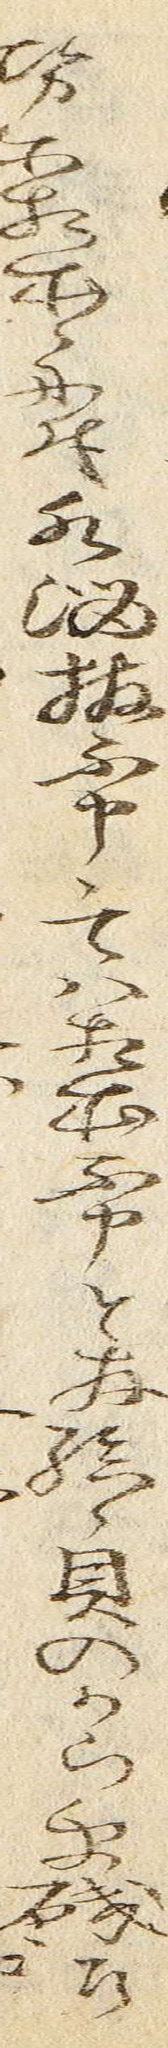勢に相成候に付水溜拵不申候てハ相成不申と存給候貝のからを磯に
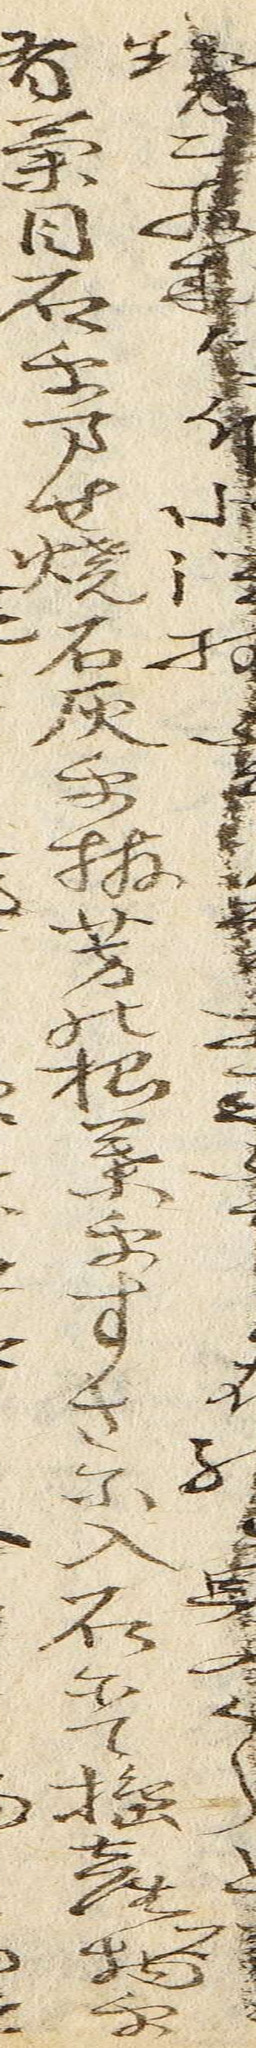有菊目石をませ焼石灰を拵芳の根葉をすさに入石にて搗産ス物を
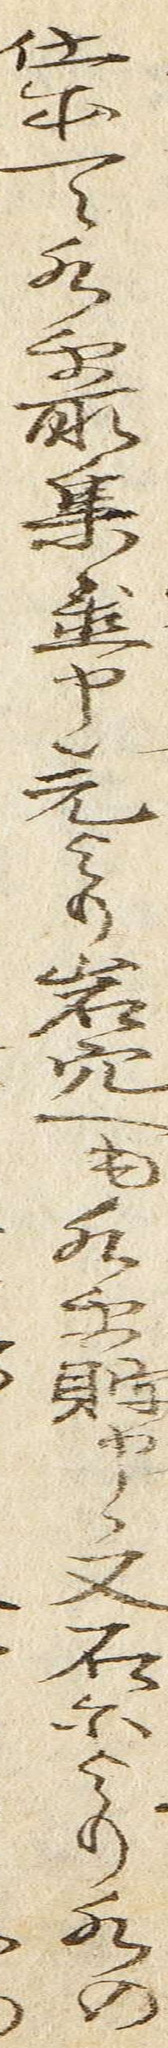仕成天水を取集置申候元より岩穴へも水を貯申候又石により水の
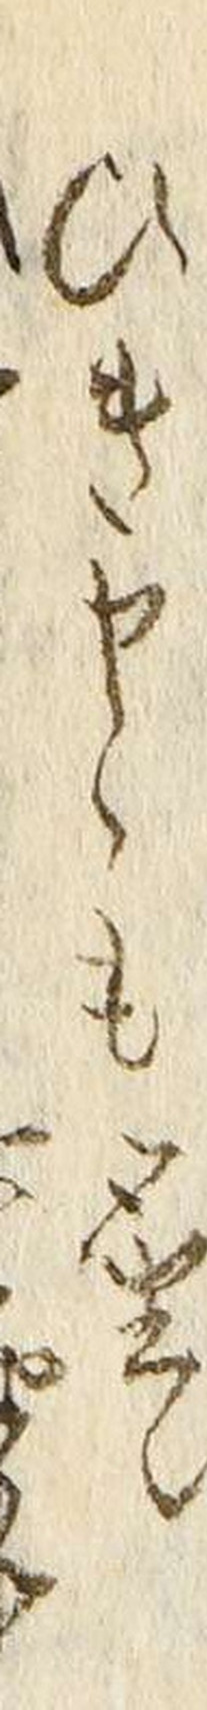ひき申候も御座候
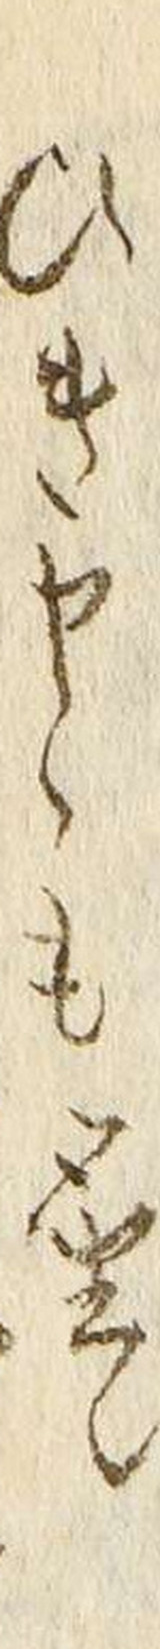ひき申候も御座候
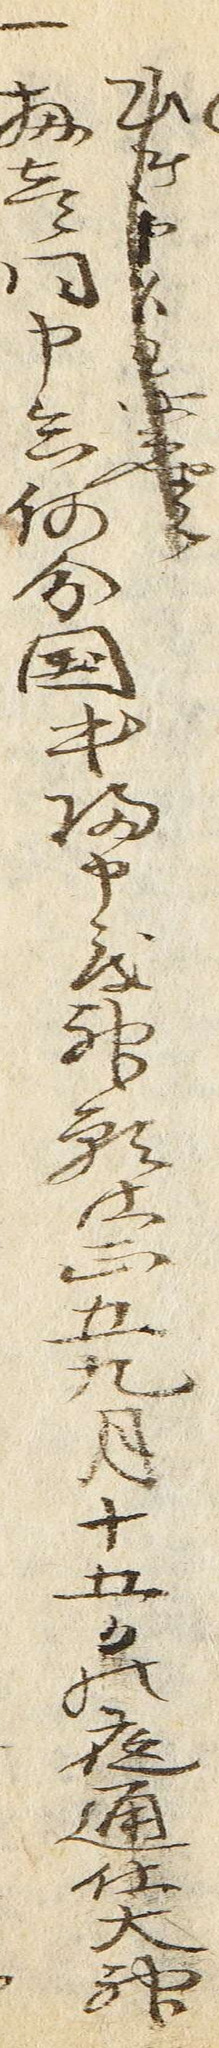一扨壱同申合何分国本帰申度神願仕正五九月十五日の夜通仕大神
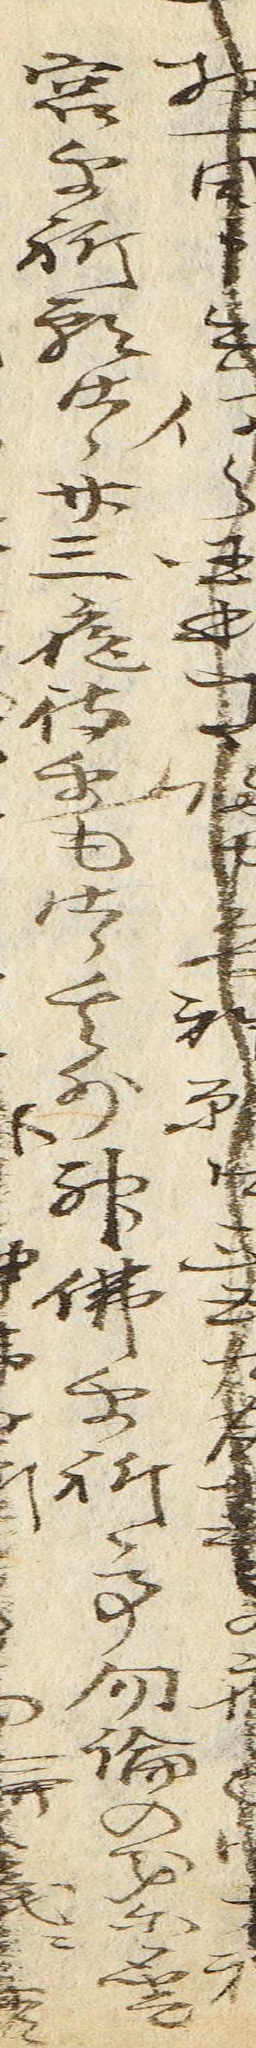宮を祈願仕候廿三夜待をも仕候其外神仏を祈候事勿論の義に御座候
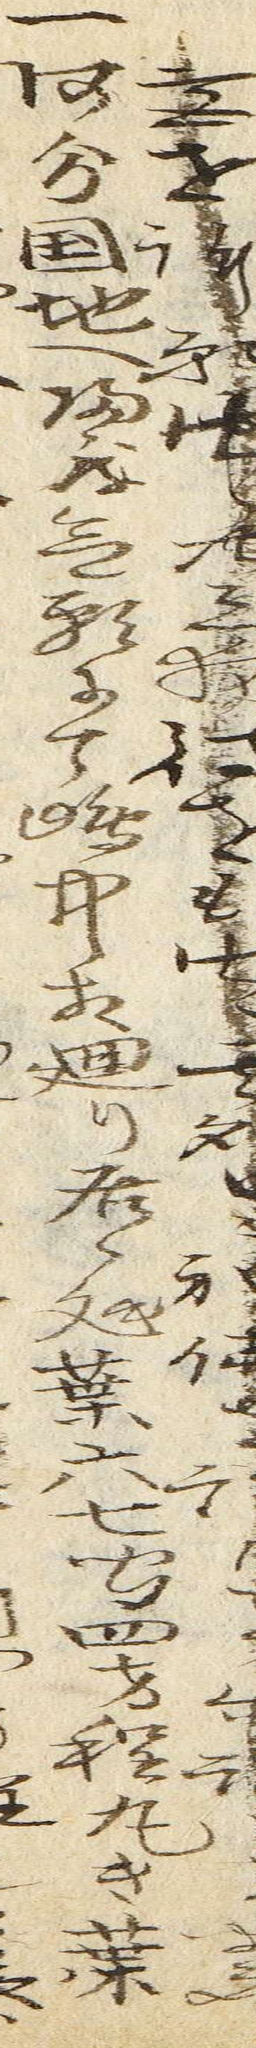一何分国地へ帰度念願にて嶋中相廻り居候処葉六七間四方程丸き葉
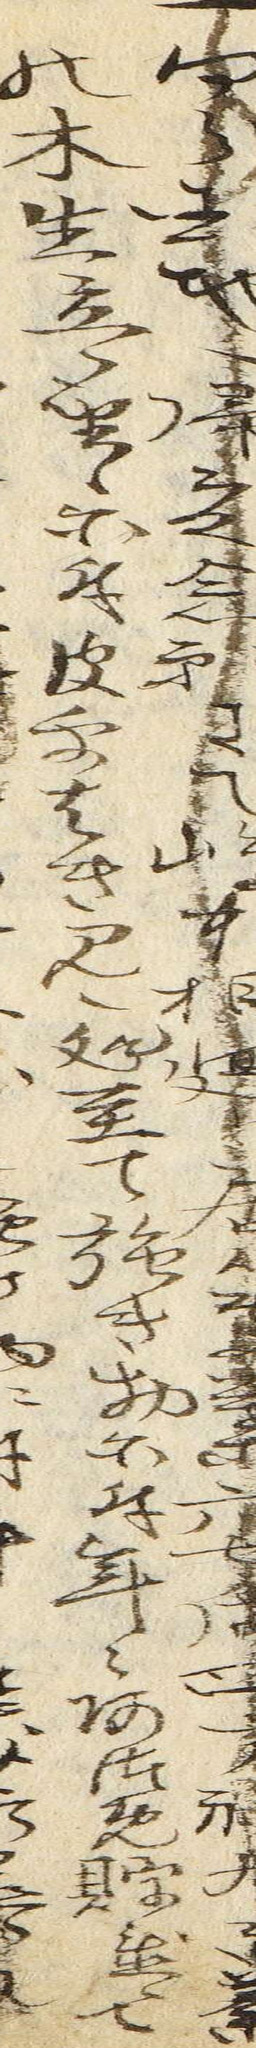の木生立御座候に付皮をはき見候処至て強き物に付年々あつめ貯置候て
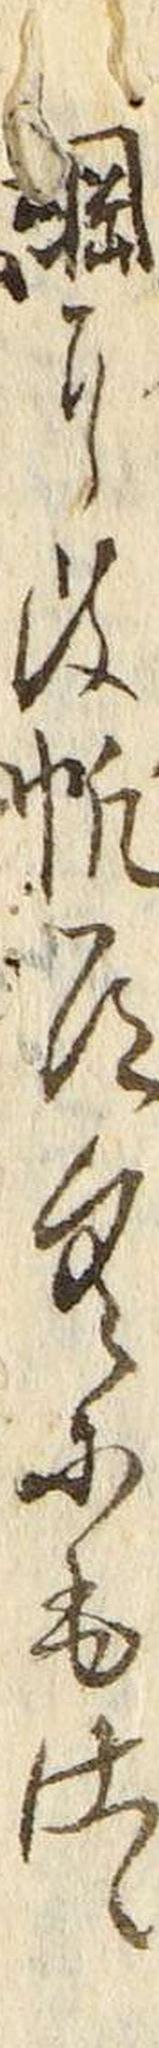綱に致帆道具にも仕候

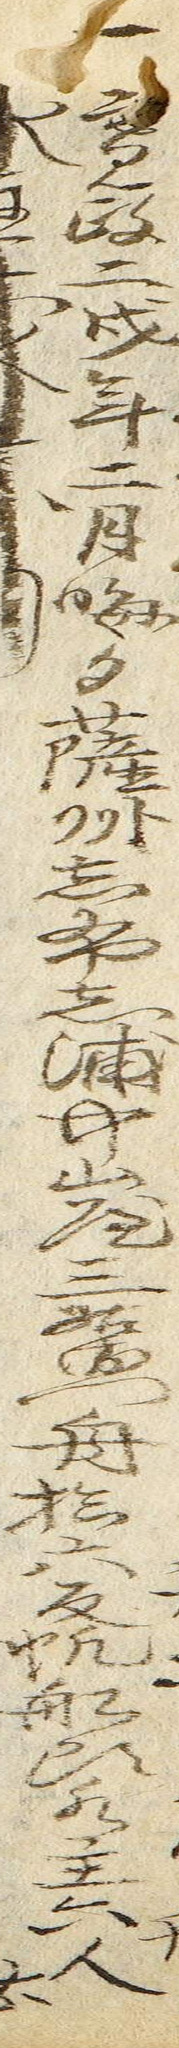一寛政二戌年二月晦日薩州志布志浦中山屋三右衛門舟拾六反帆船頭水主六人乗
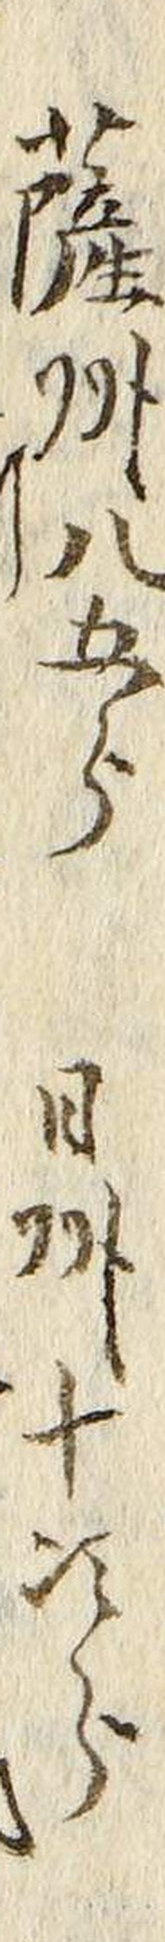薩州八五郎日州十次郎
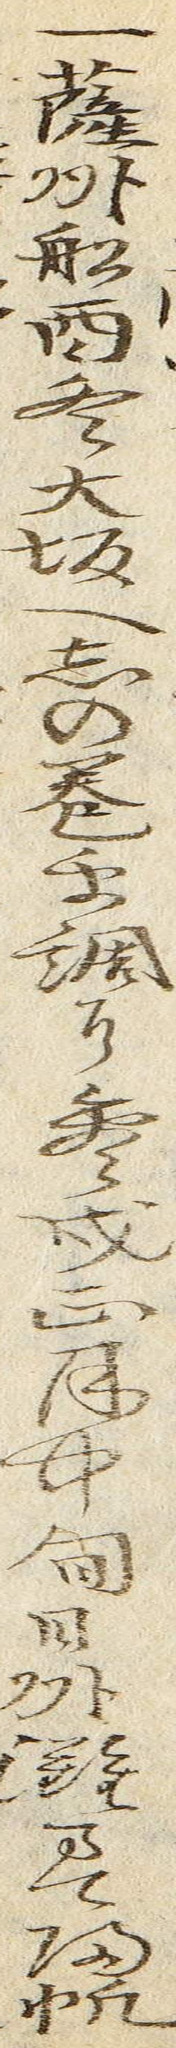一薩州船酉冬大坂へしの巻を調に参戌正月中旬日州灘まて帰帆
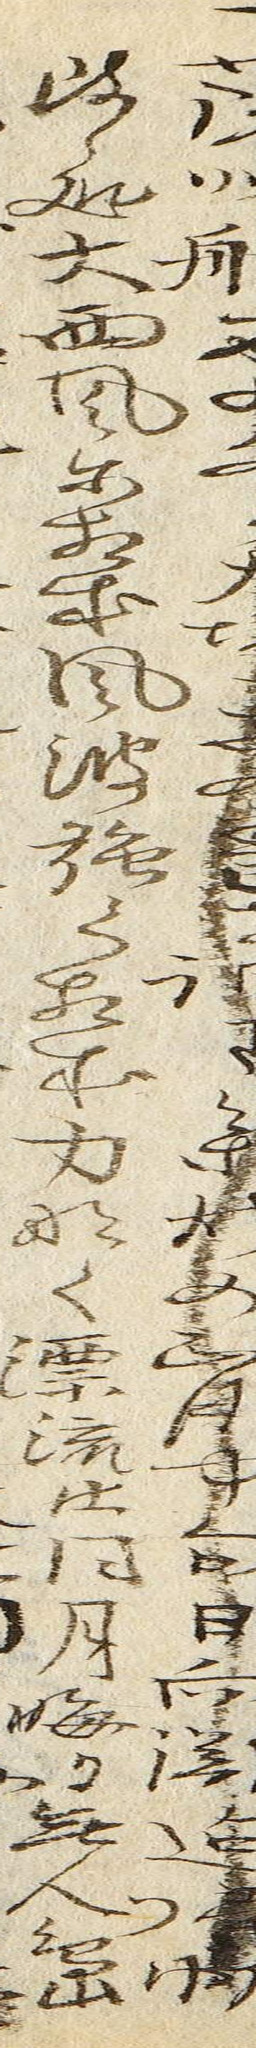致候処大西風に相成風波強く相成力なく漂流仕同月晦日無人島
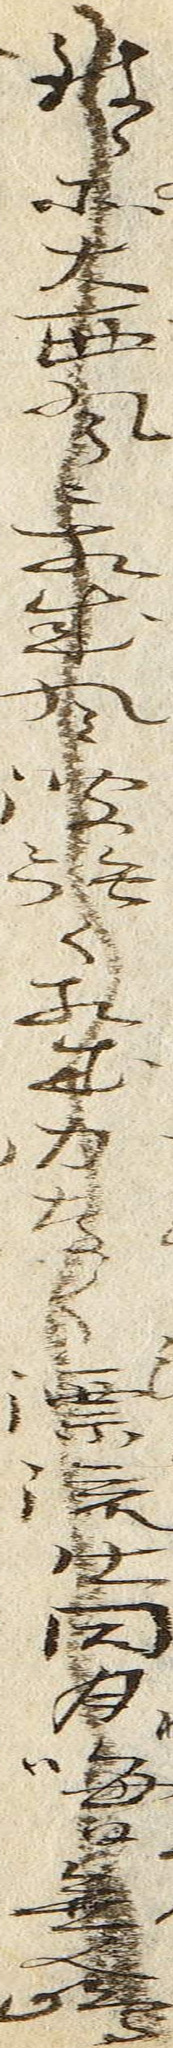致候処大西風に相成風波強く相成力なく漂流仕同月晦日無人島
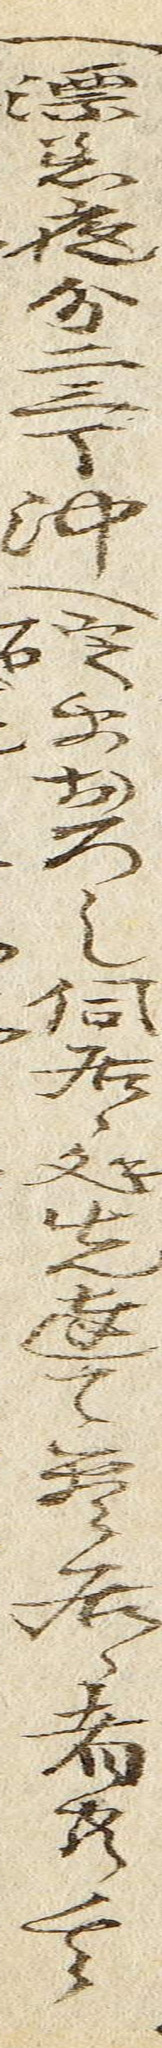へ漂着夜分二三丁沖へ碇をおろし伺居候処先達て参居候者共其
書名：無人島漂流書付
